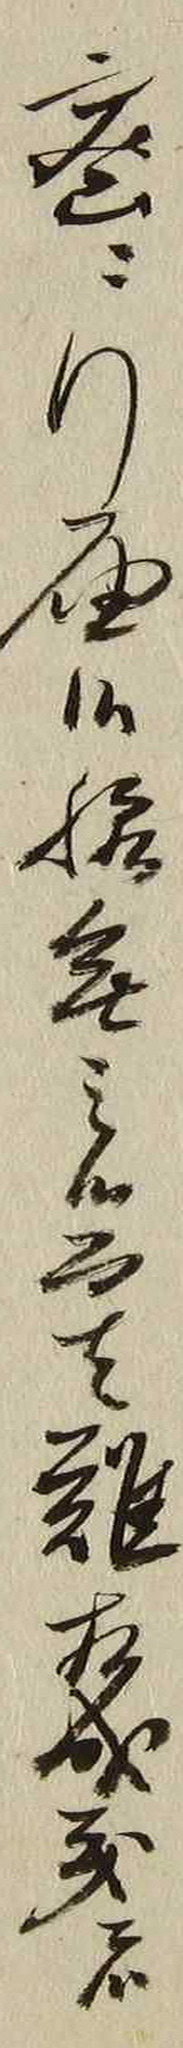密ニ行届候様無之候而は難相成義ニ候
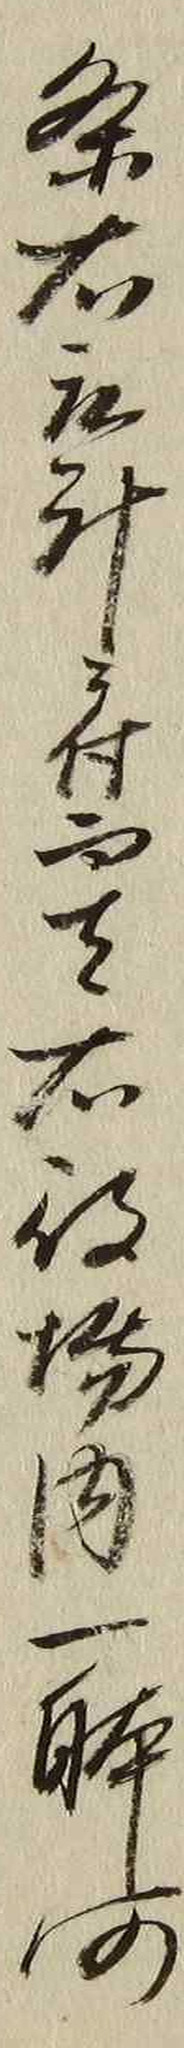条右取計ニ付而は右役場内一体何
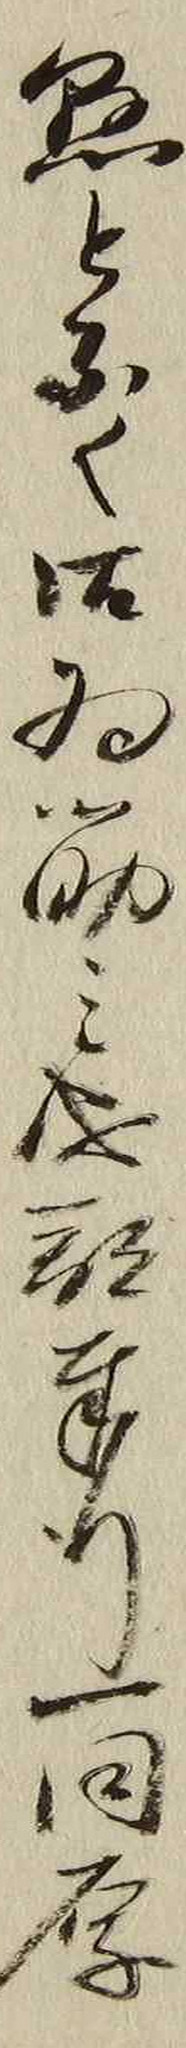懸となく御為筋之儀郡奉行一同厚
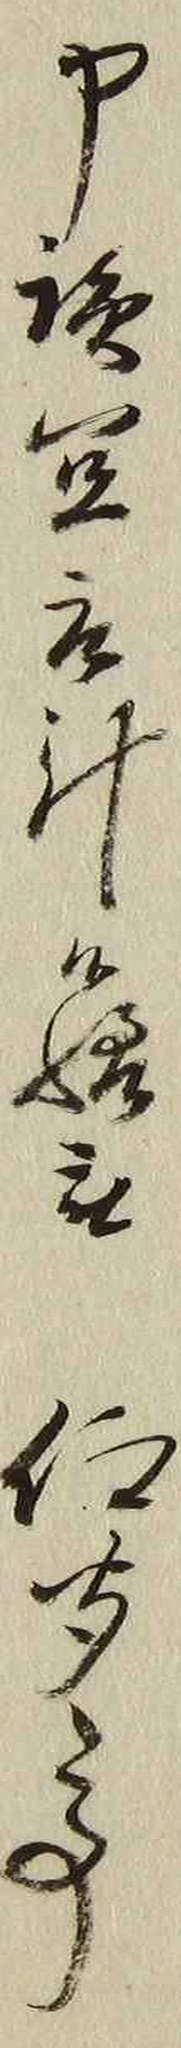申談宜取計候様被仰聞候事
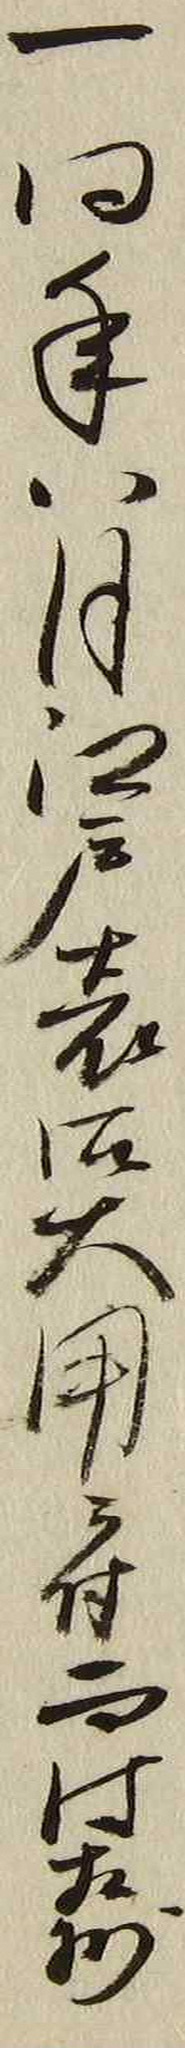一同年八月江戸表御大用ニ付而は相州
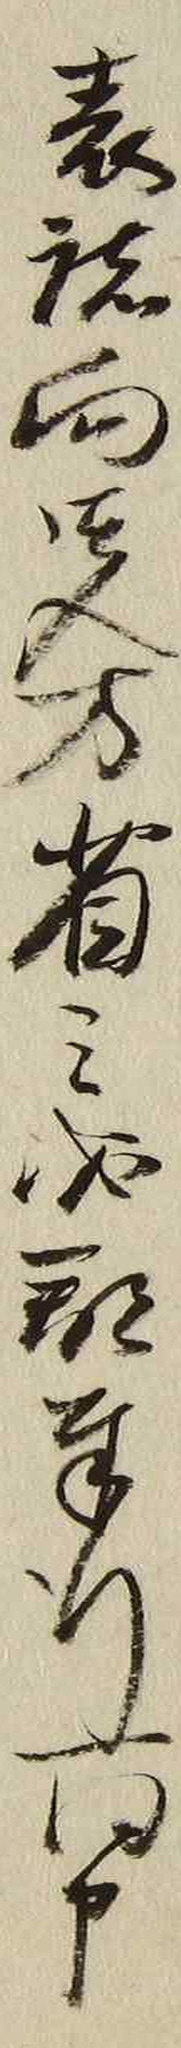表諸向御人方省之儀郡奉行一同申
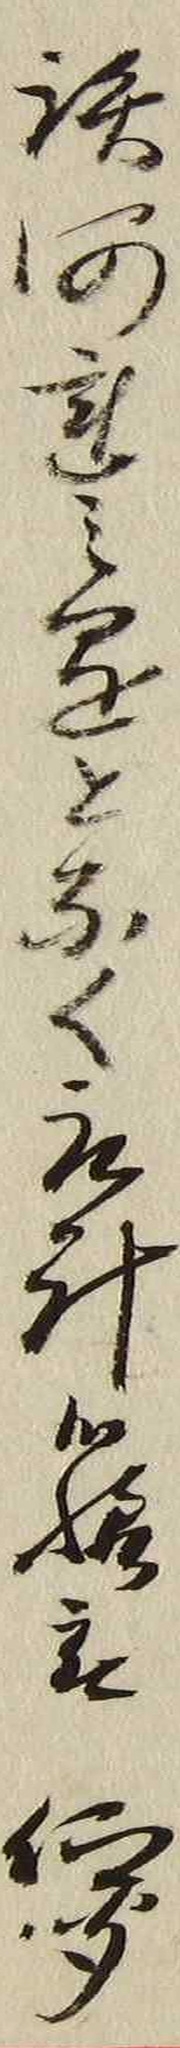談何れ之懸となく取計候様被仰聞
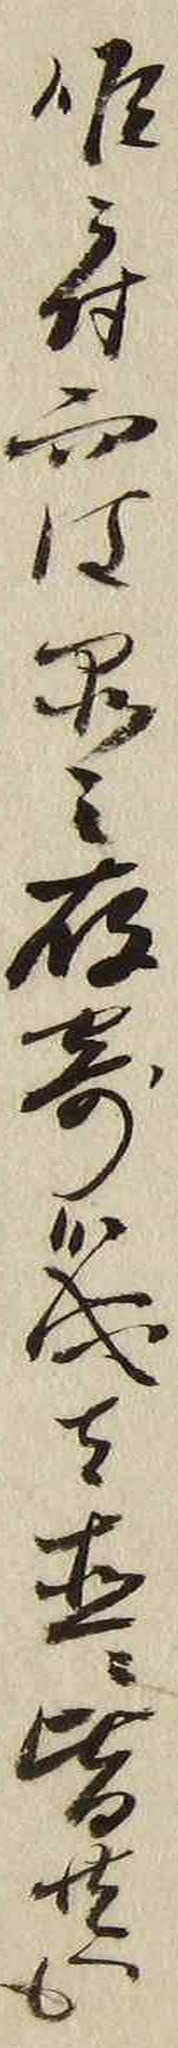候ニ付而は品之存寄候儀は直ニ皆共へも
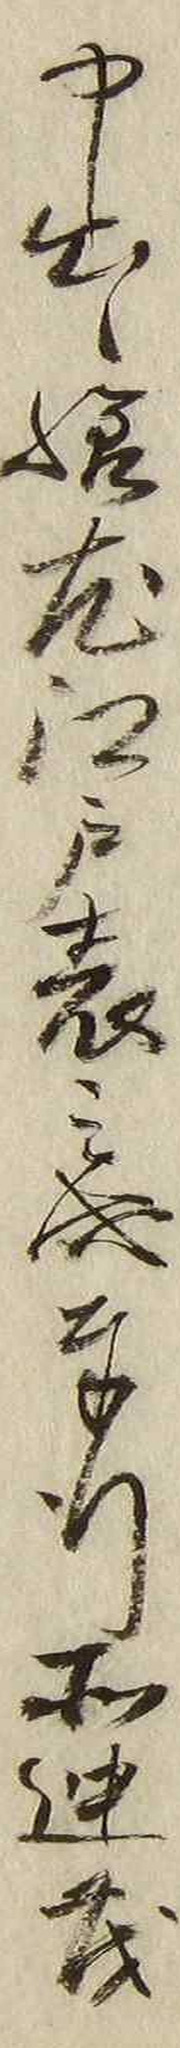申出候様尤江戸表之儀奉行所迚も

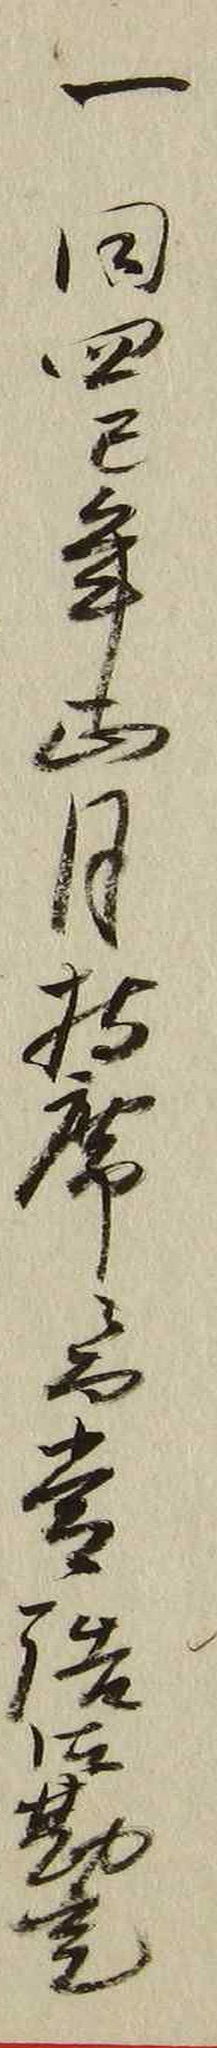一同四巳年正月持席ニ而常詰御勘定
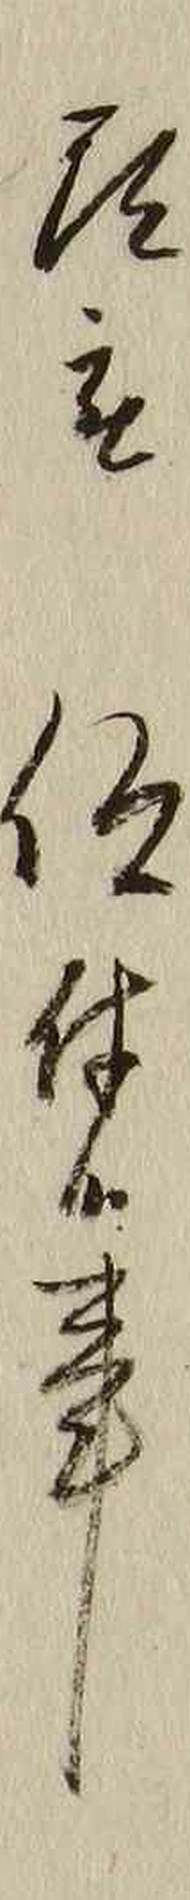頭被仰付候事
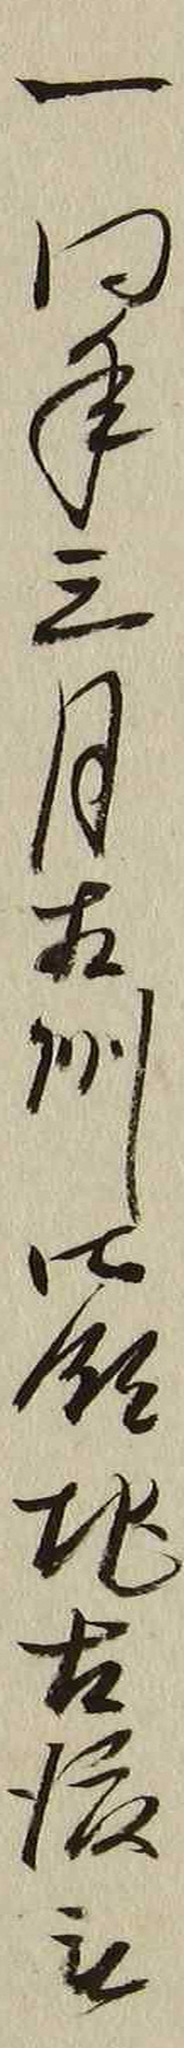一同年三月相州御領地相渡被
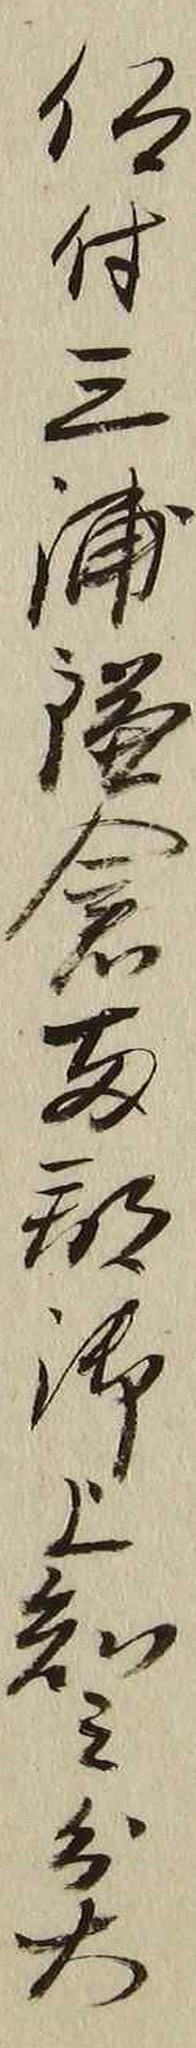仰付三浦鎌倉両郡御上知之分大
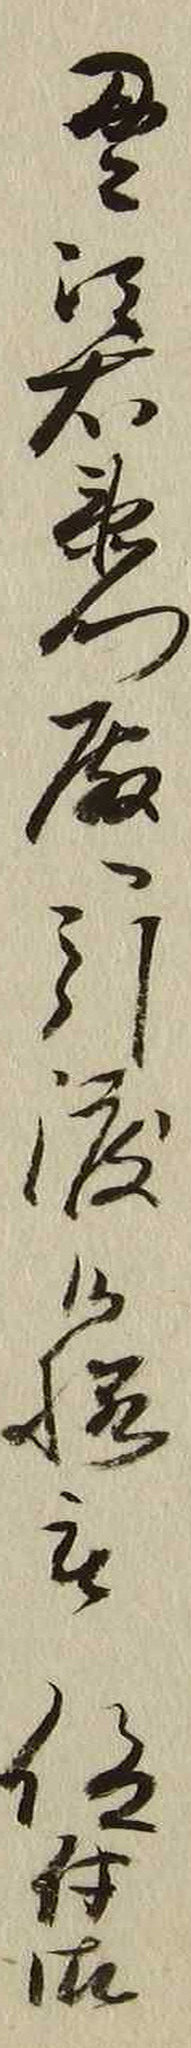貫次右衛門殿へ引渡候様被仰付御
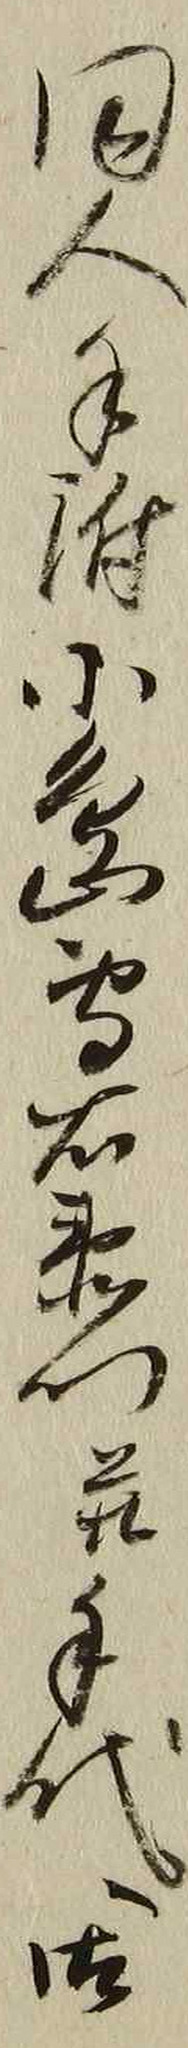同人手附小島専右衛門并手代へ御
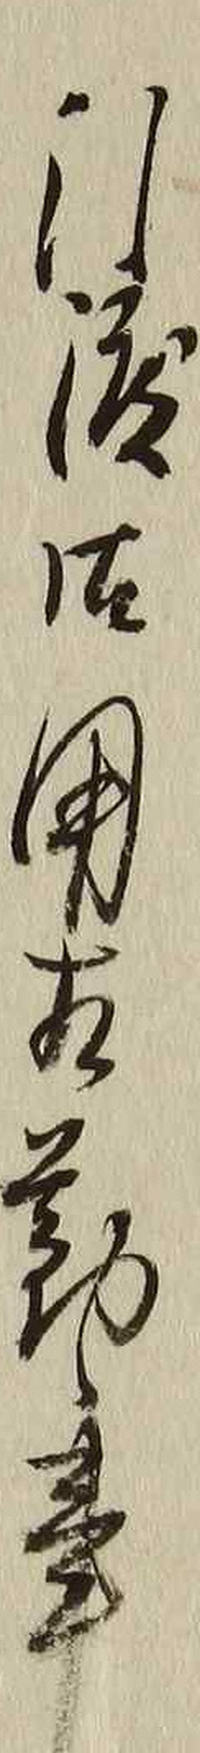引渡御用相勤候事
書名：諸士系譜　巻之352　す之部2
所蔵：会津若松市立会津図書館
